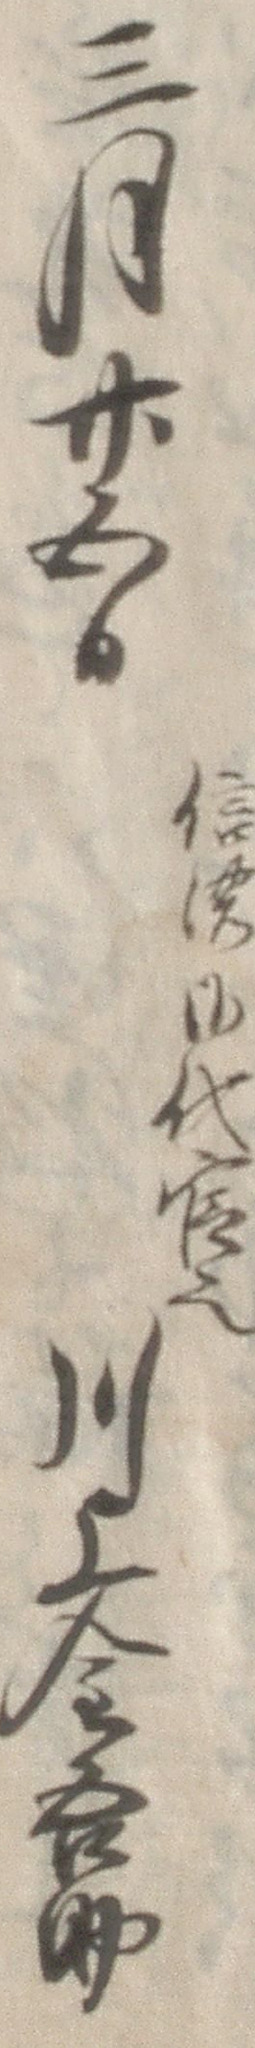三月廿五日川上金吾助
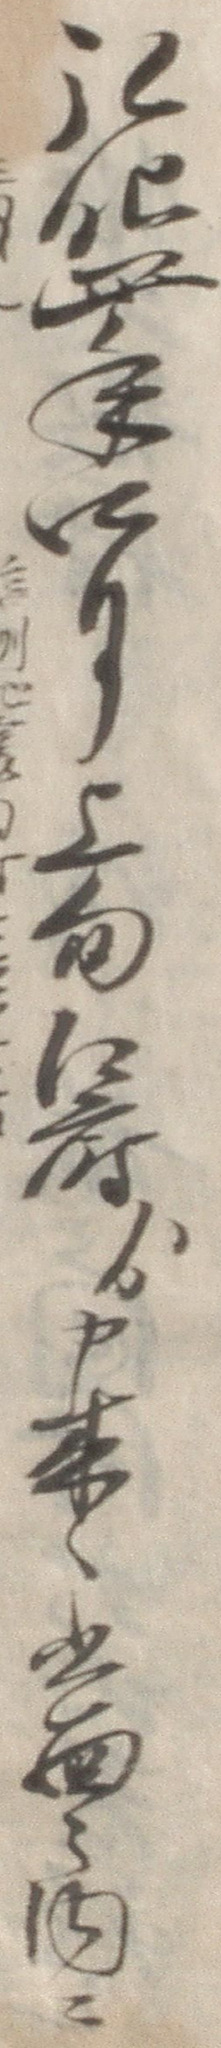弘化四年四月上旬江府ゟ申来候書面之内二
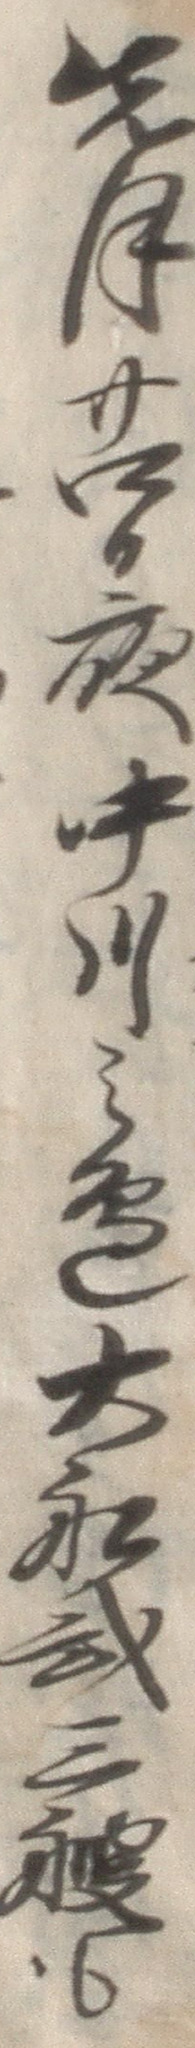先月廿四日夜中川之辺,大船弐三艘も
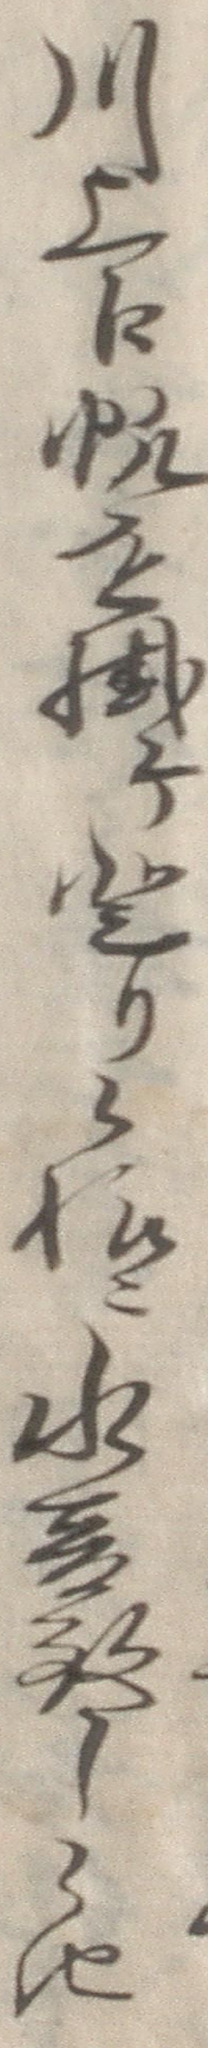川上江帆を掛ヶ登り候様二水音致し候由
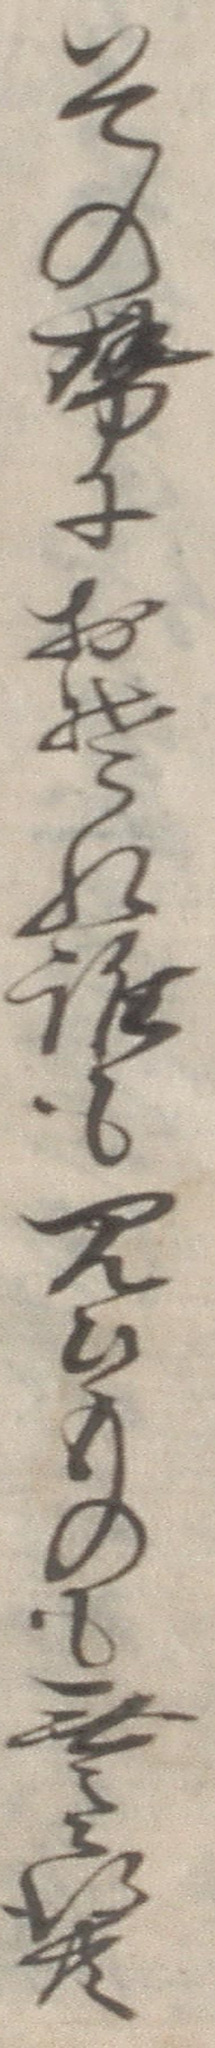その勢におそれ誰も見候ものも無之候得共
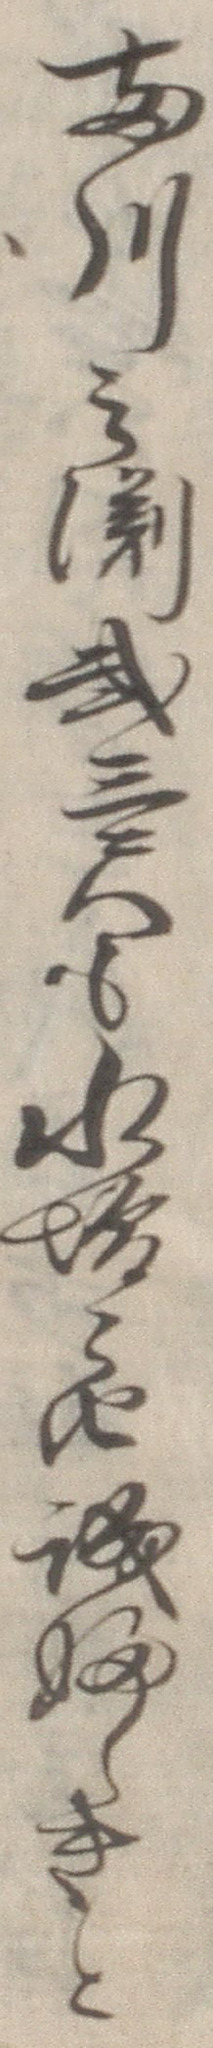両川之渕弐三尺も水増候由誠ふしきと
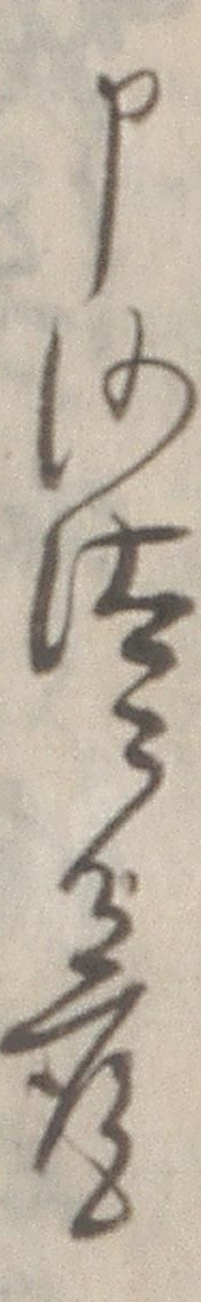申沙汰二御座候
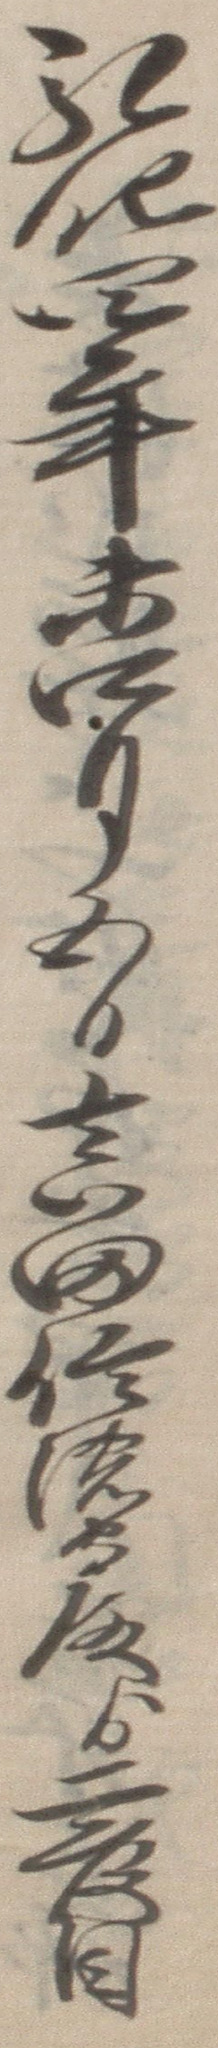弘化四年未四月五日真田信濃守殿ゟ二度目
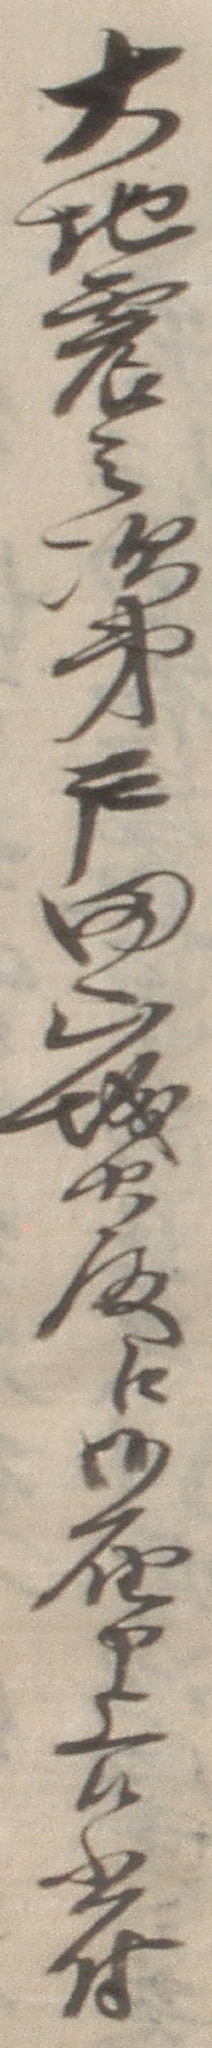大地震之次第戸田山城守殿江御届申上候書付
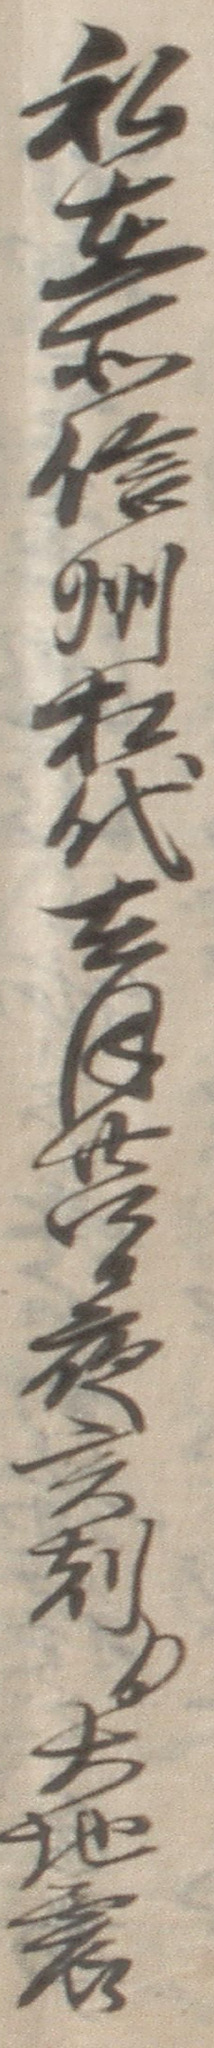私在所信州松代去月廿四日夜亥刻ゟ大地震
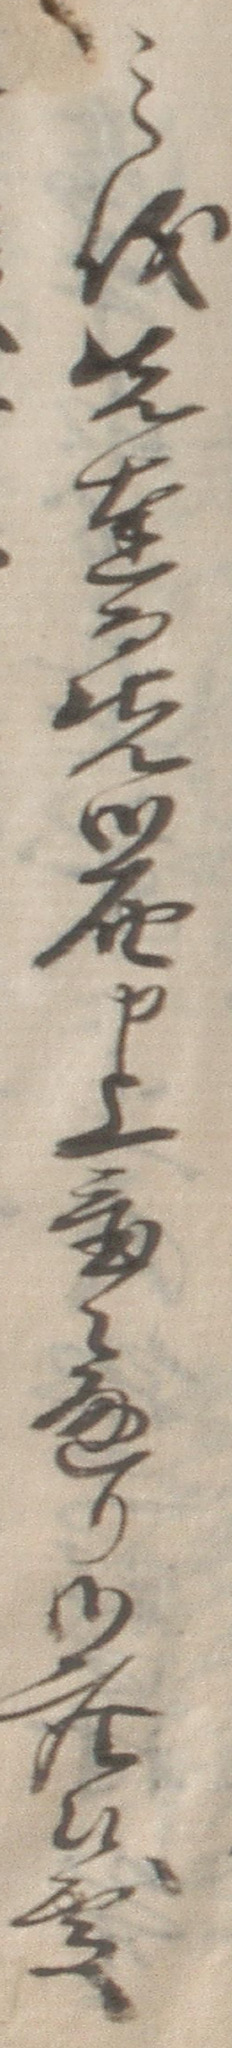之儀先達而先御届申上置候通り御座候処
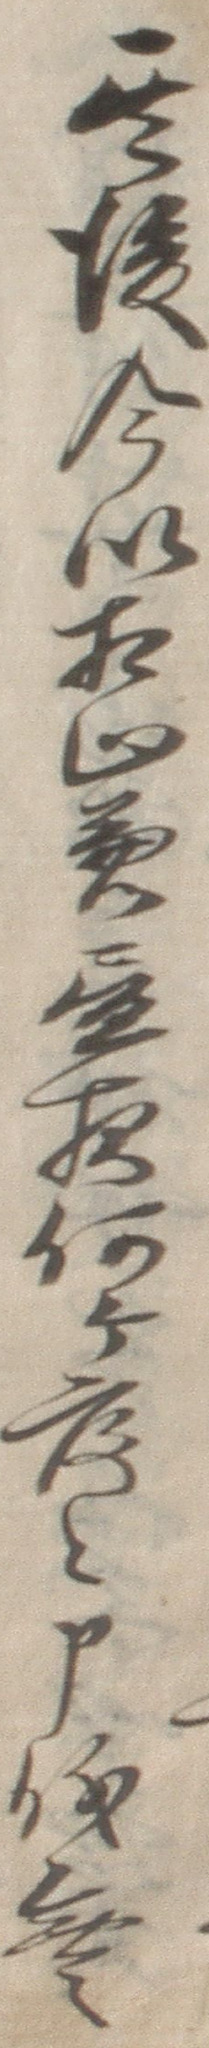其後今以相止兼昼夜何ヶ度と申儀無之
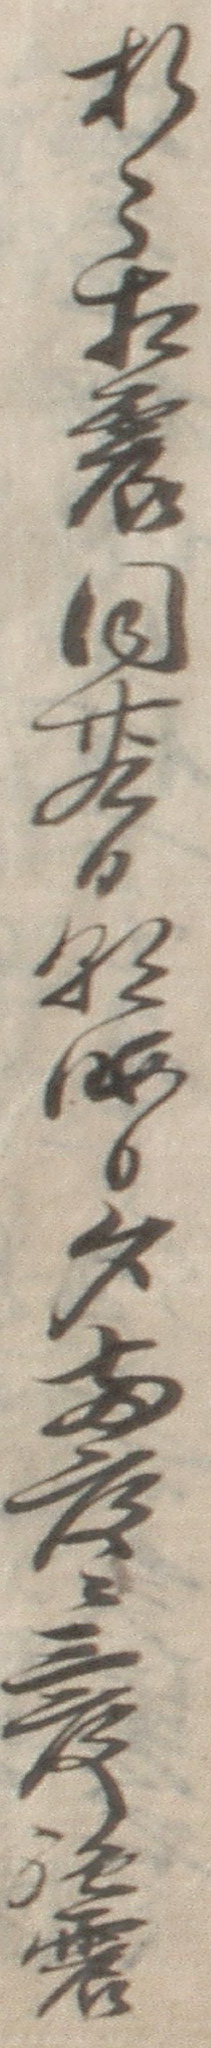折々相震同廿九日朝晦日夕両度ニ三度強震
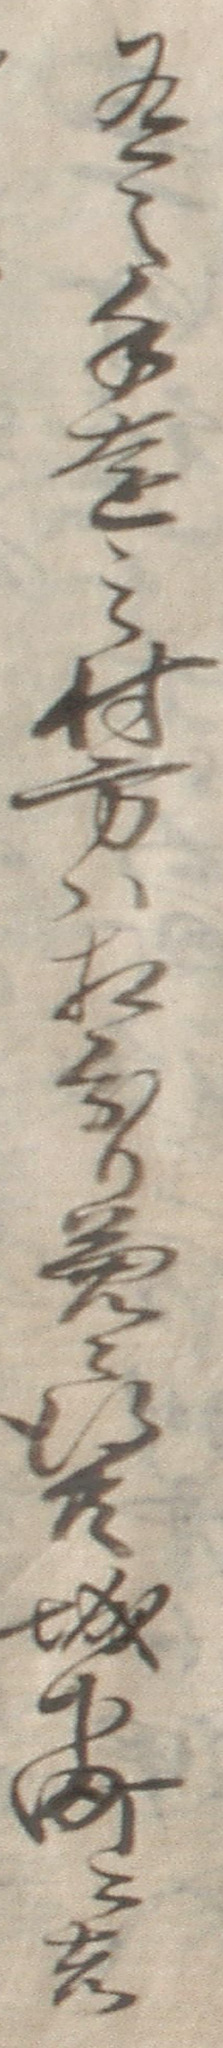有之手遠之村方ハ相分兼候得共城下町二は
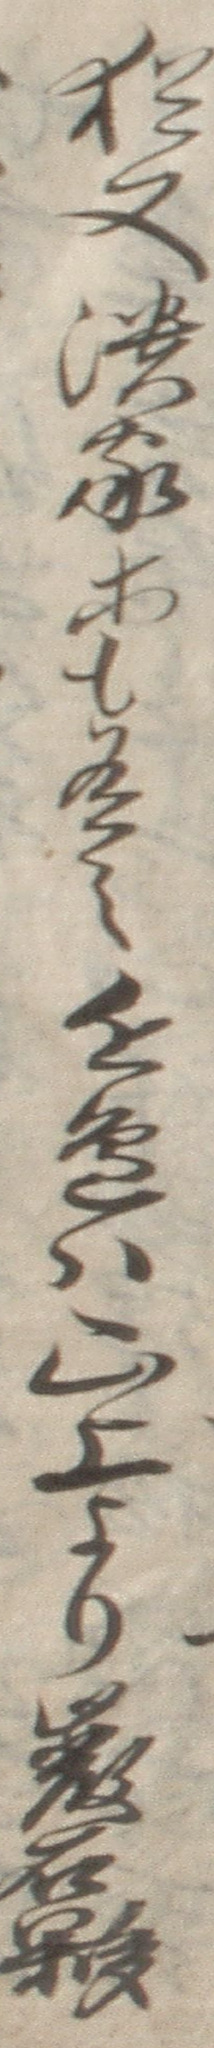猶又潰家等も有之近辺ハ山上より巌石夥
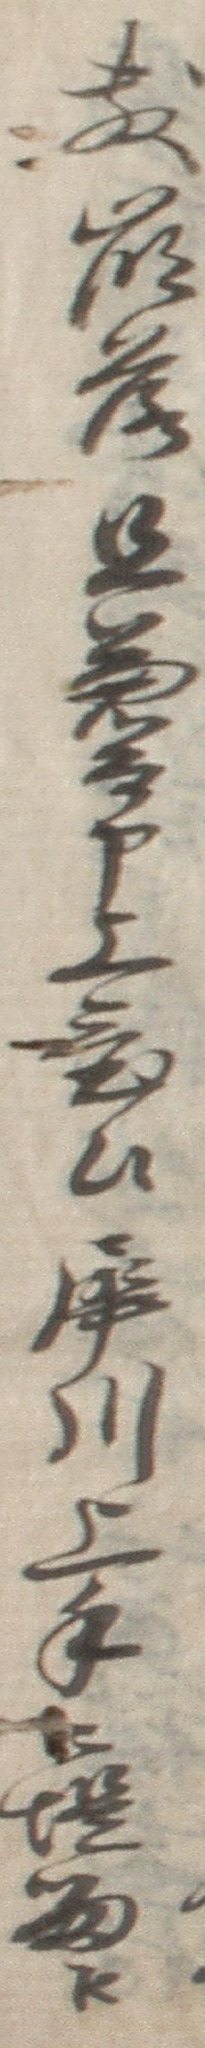敷崩落且兼而申上置候犀川上手二堤留江
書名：信州地震一件
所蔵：東京大学地震研究所図書室 Earthquake Research Institute Library, The University of Tokyo, JAPAN
